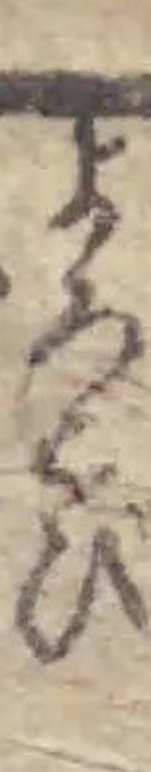よろこび
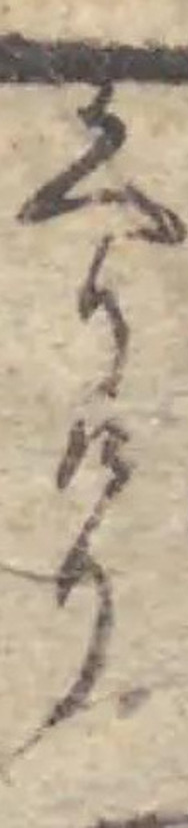かへりけり
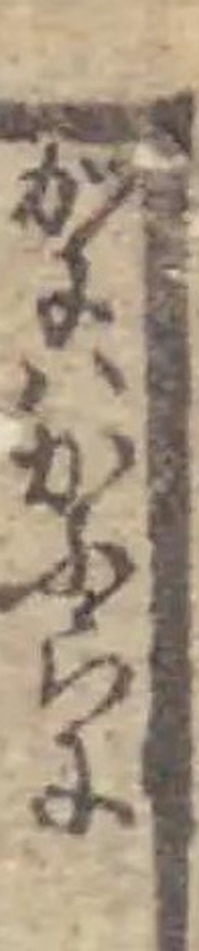かにはかふらに
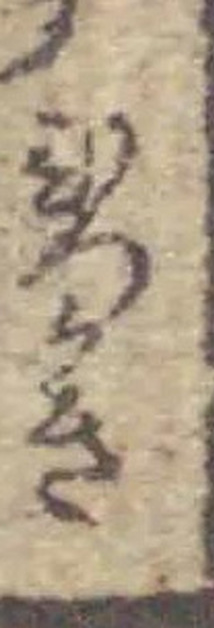ひつかき
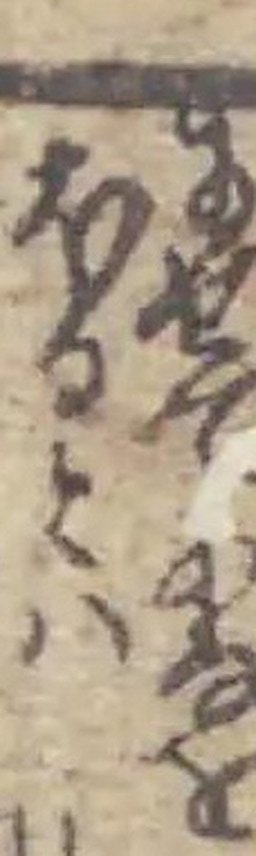ほるとは
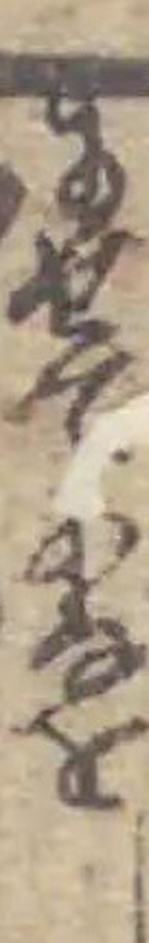にせてあなを
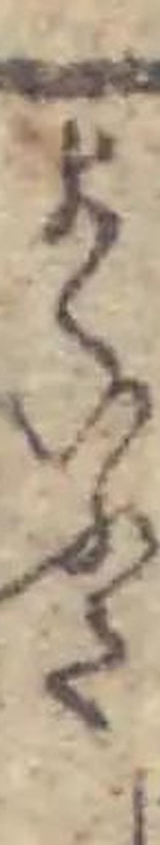よくいふた
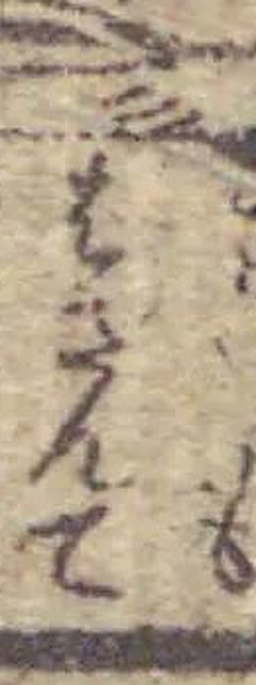はさんて
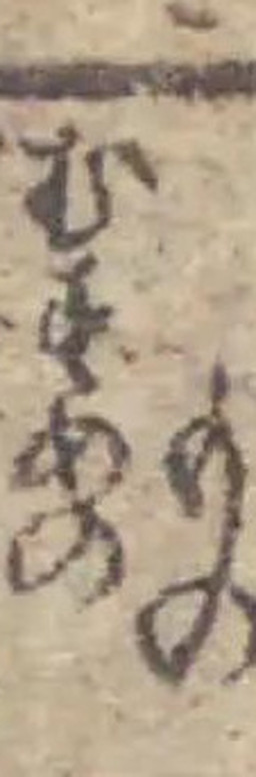むすめの
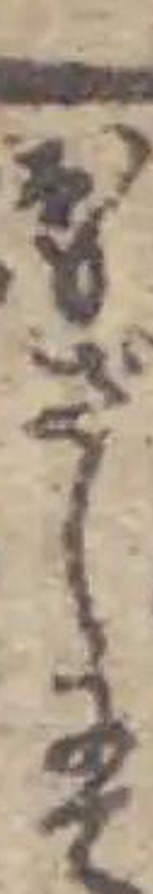おもざしにて
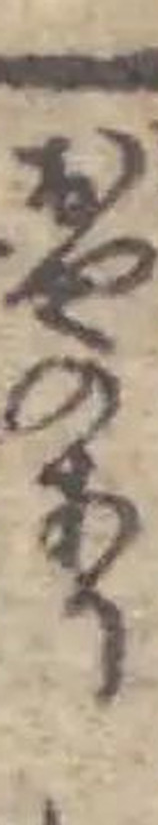おやのあり
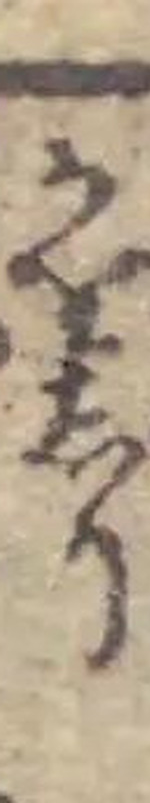かをしり
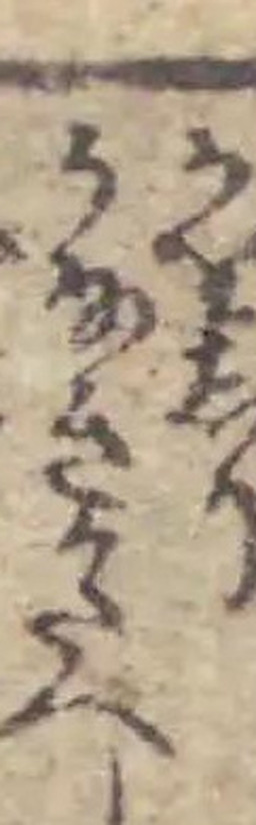うなぎかたへ
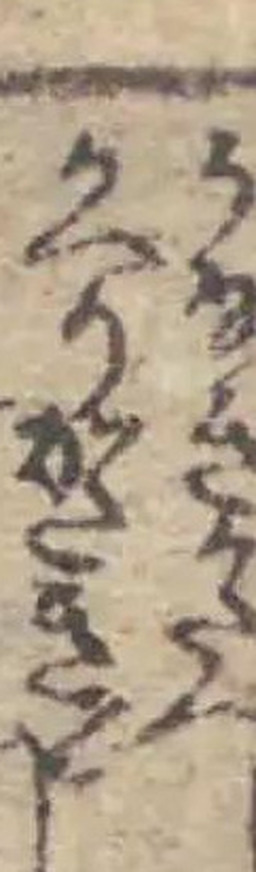かへりかたきを
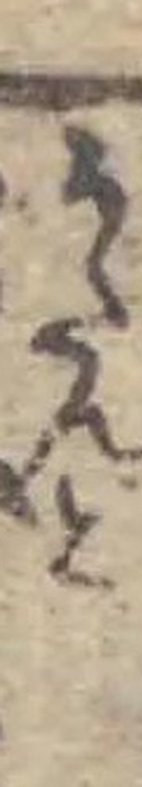うたんと
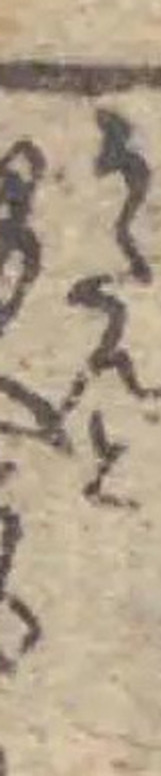うたんと
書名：蟹牛房挟多 3巻
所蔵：国立国会図書館 National Diet Library, JAPAN
